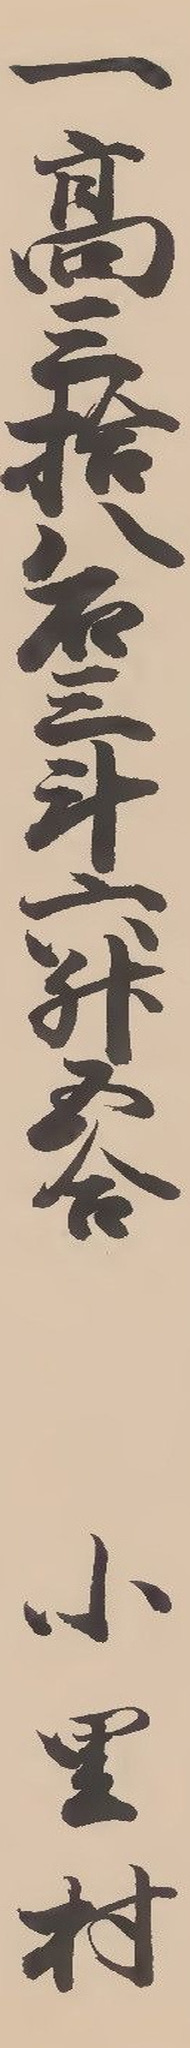一高三拾八石三斗六升五合小里村
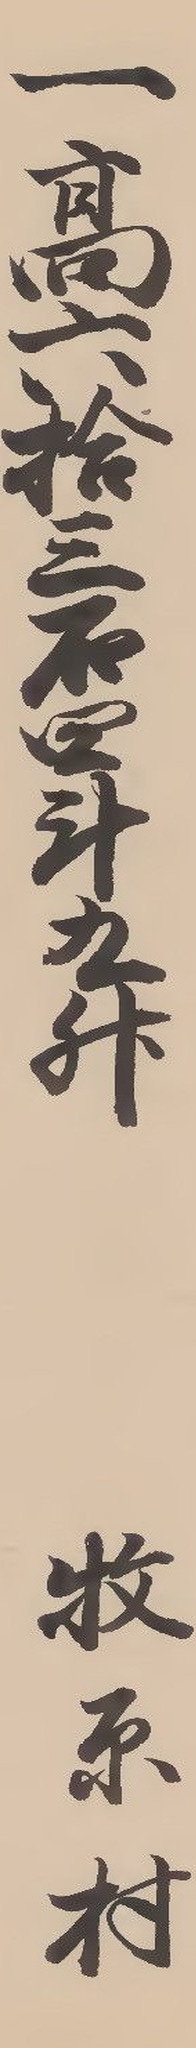一高六拾三石四斗九升牧原村

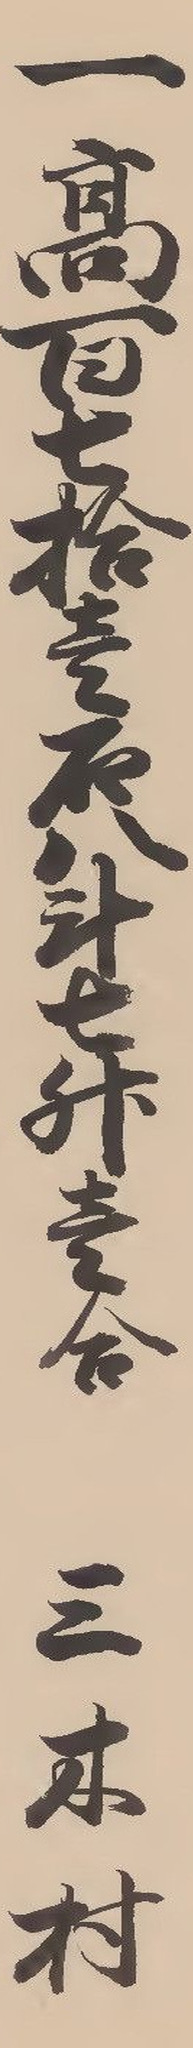一高百七拾壱石八斗七升壱合三木村
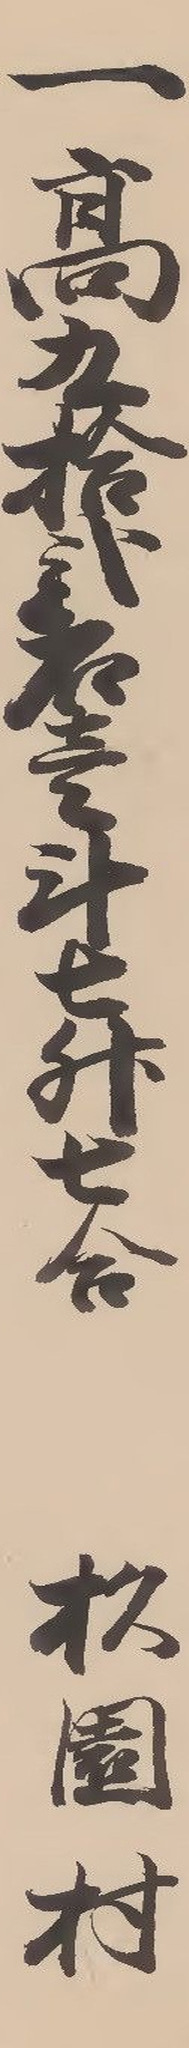一高九拾弐石壱斗七升七合杉園村
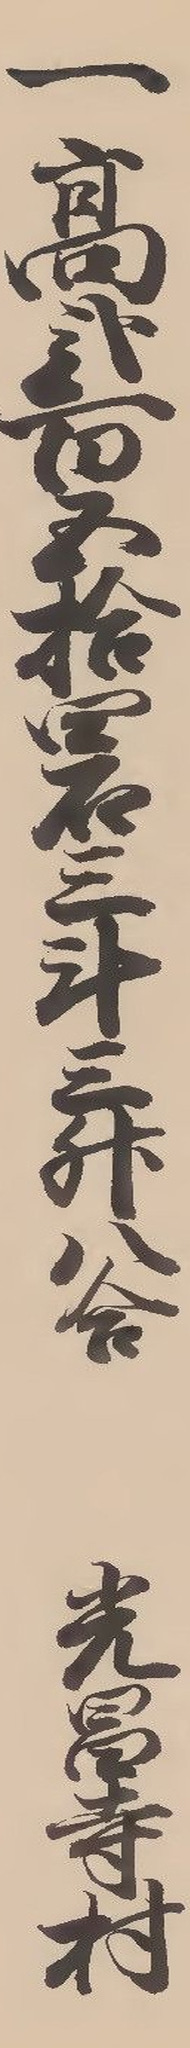一高弐百五拾四石三斗三升八合光昌寺村
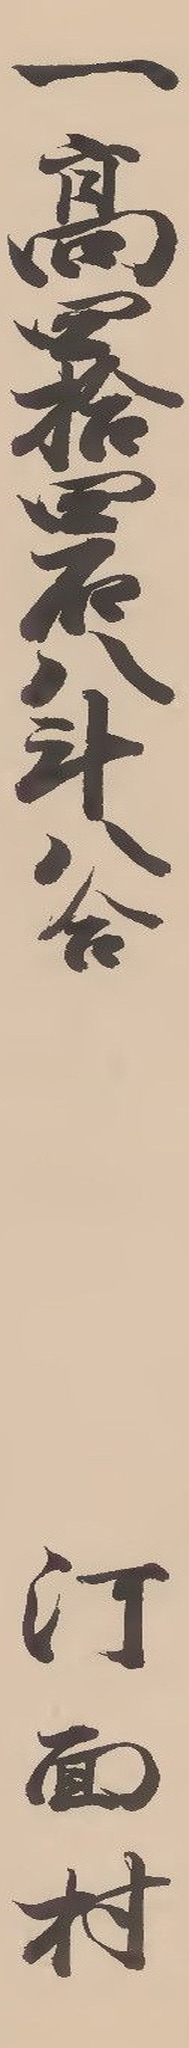一高四拾四石八斗八合河面村
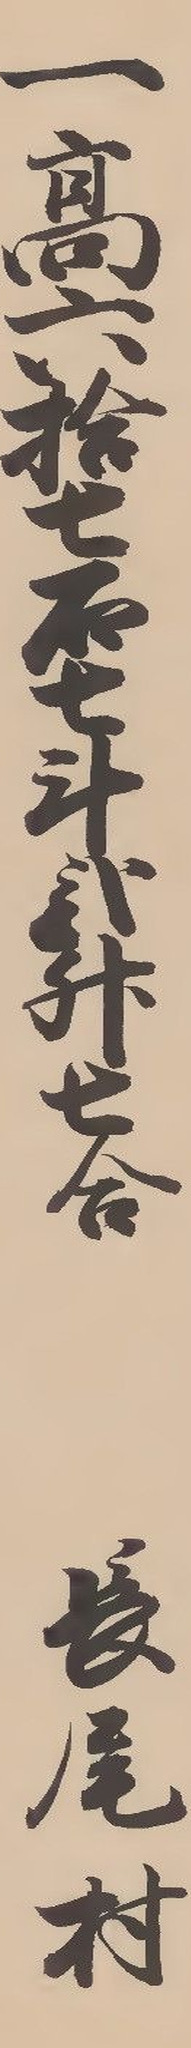一高六拾七石七斗弐升七合長尾村
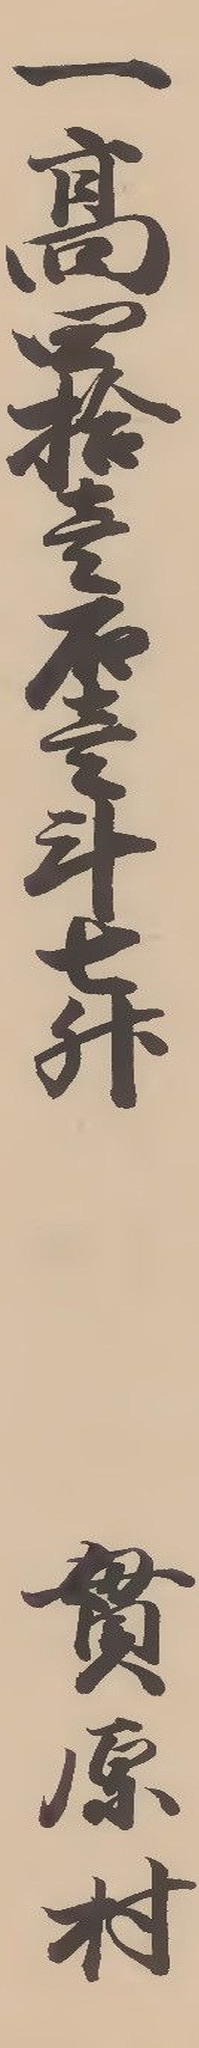一高四拾壱石壱斗七升貫原村
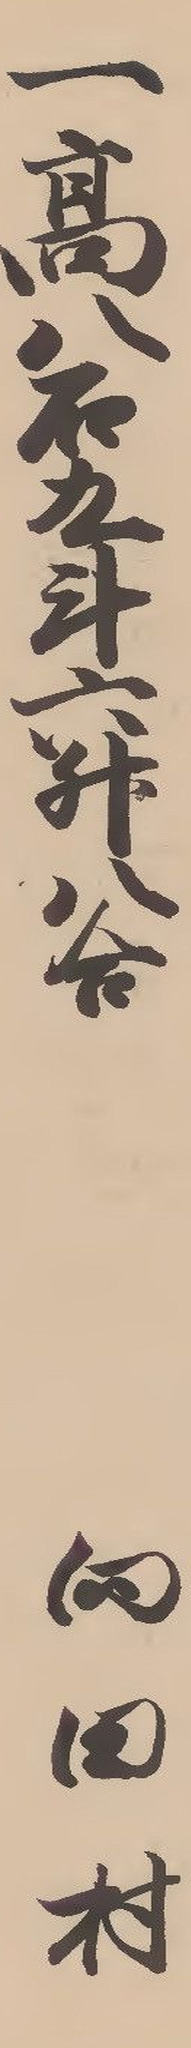一高八石九斗六升八合向田村
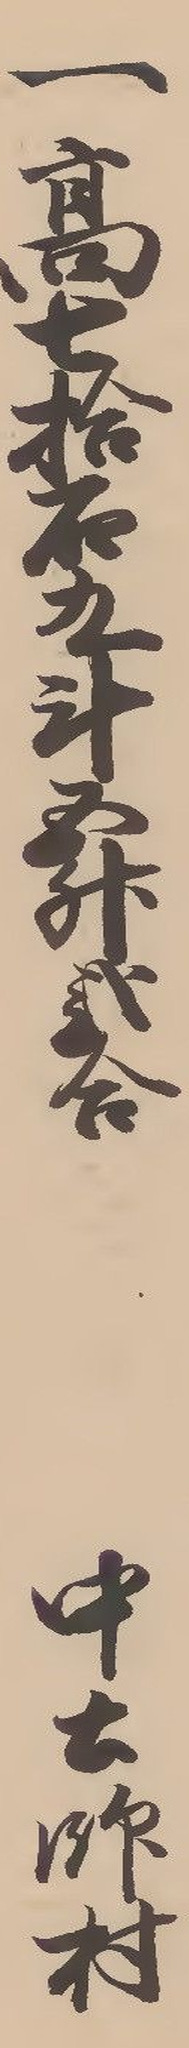一高七拾石九斗五升弐合中土師村

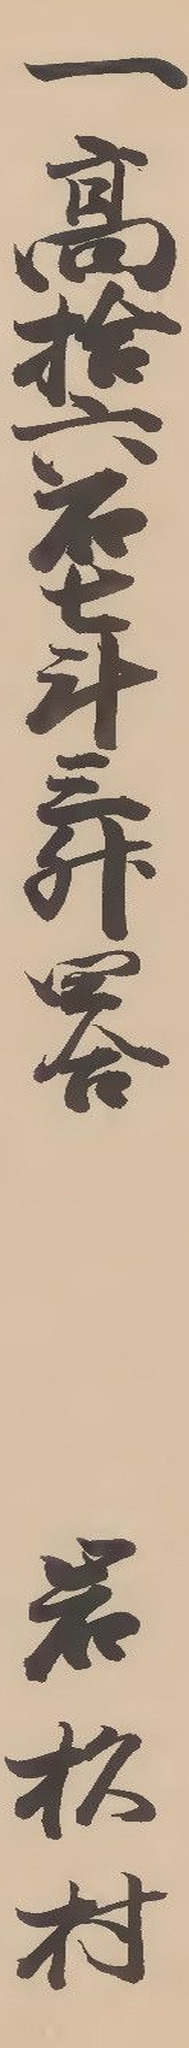一高拾六石七斗三升四合岩杉村
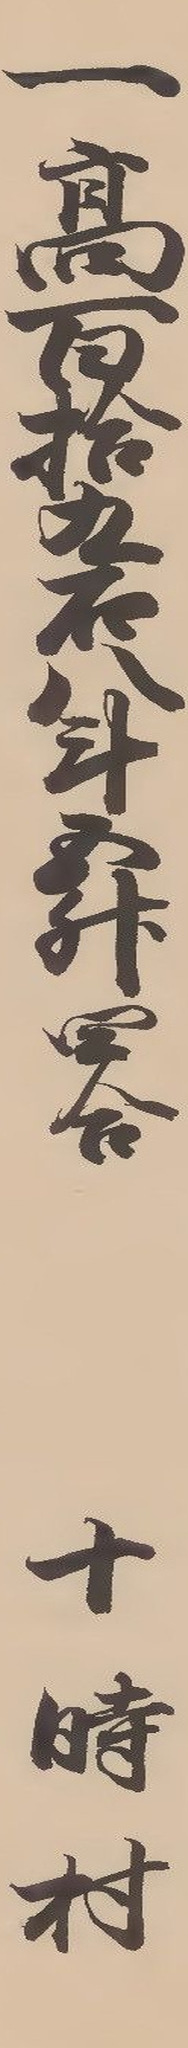一高百拾九石八斗五升四合十時村
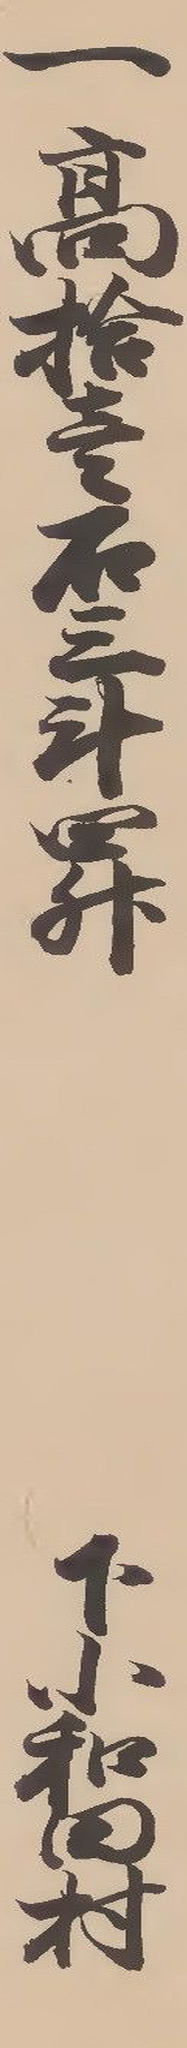一高拾壱石三斗四升下小和田村
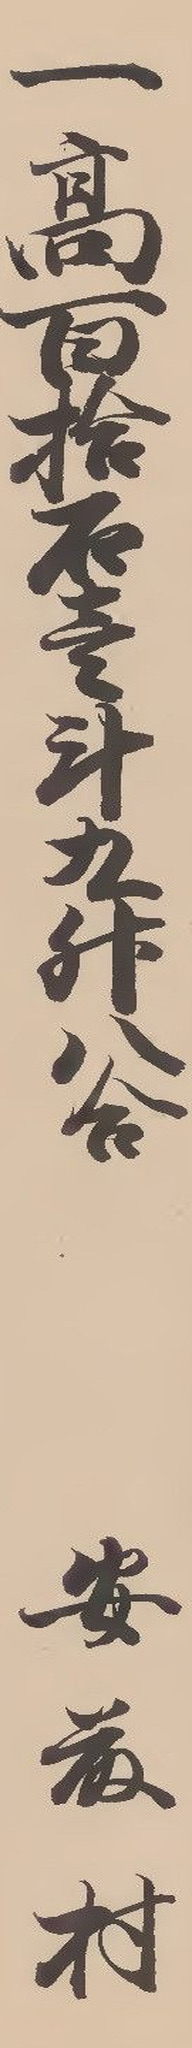一高百拾石壱斗九升八合安藤村
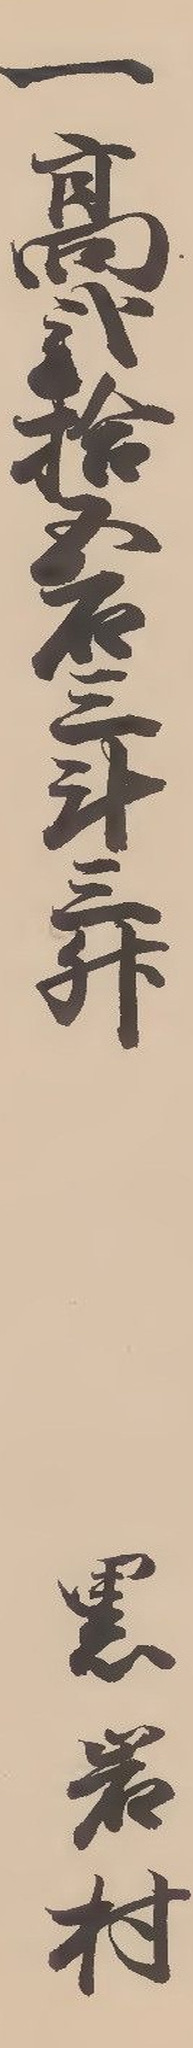一高弐拾五石三斗三升黒岩村
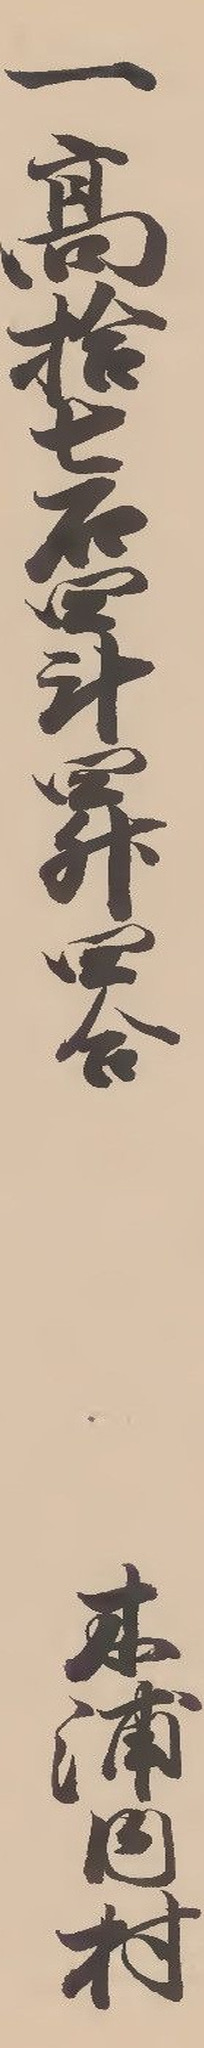一高拾七石四斗四升四合木浦内村
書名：豊後国郷帳
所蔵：国立公文書館 National Archives of Japan
